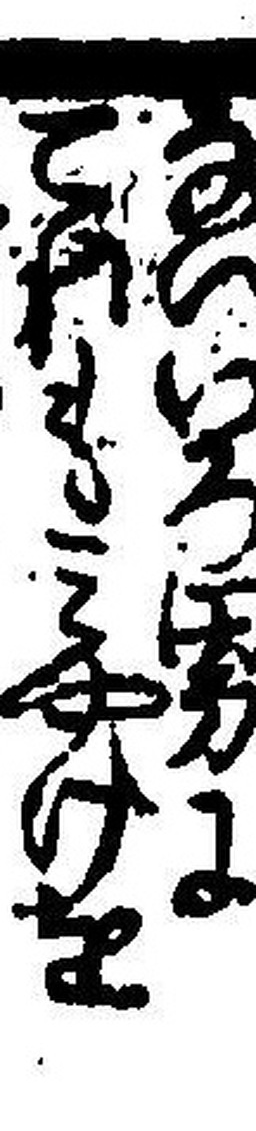これもみやけを
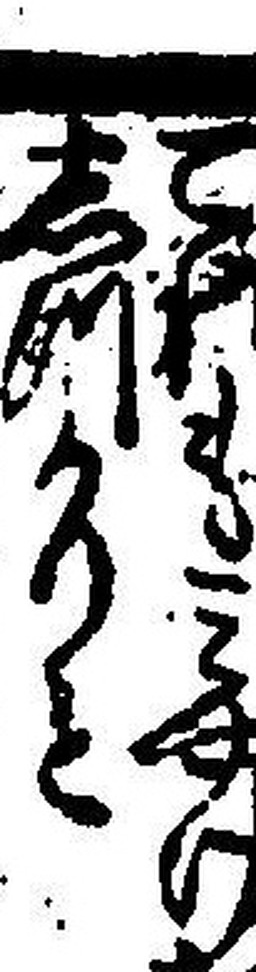しつかりと
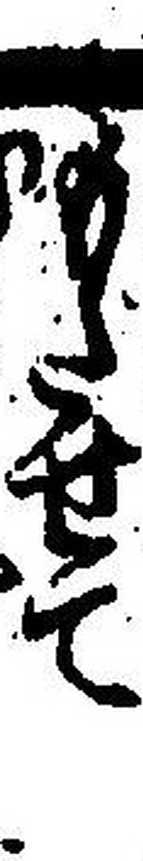もたせて
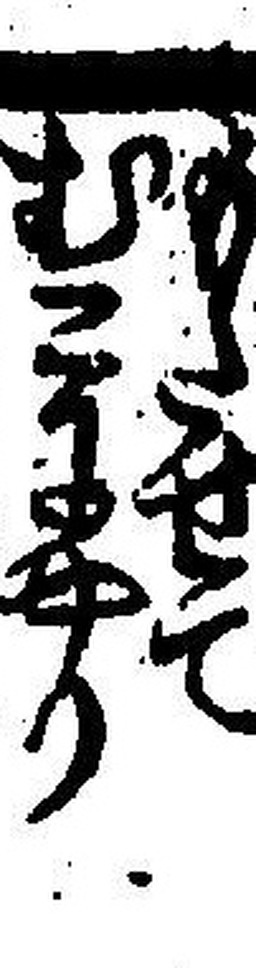むこにやり
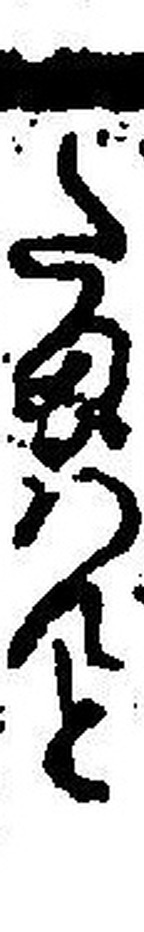たまはんと
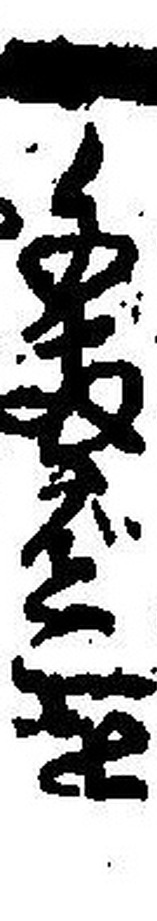千両ばこを
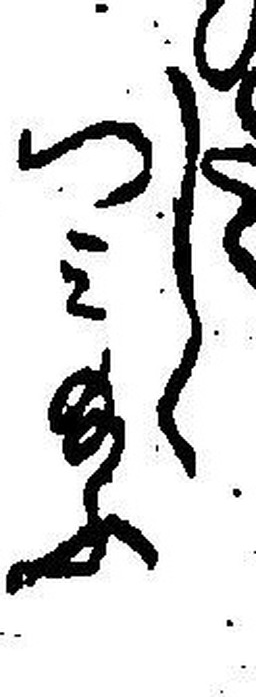つみ給ふ

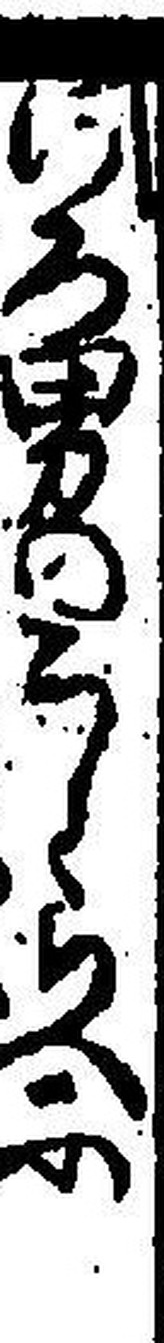いろ男のこしらへに
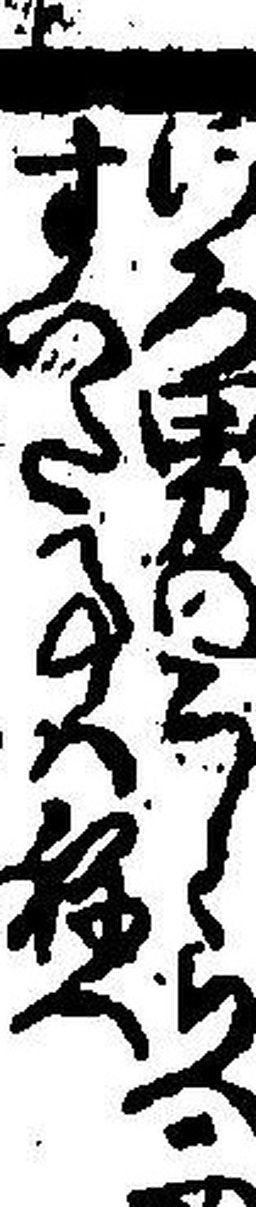すいた事はねへ
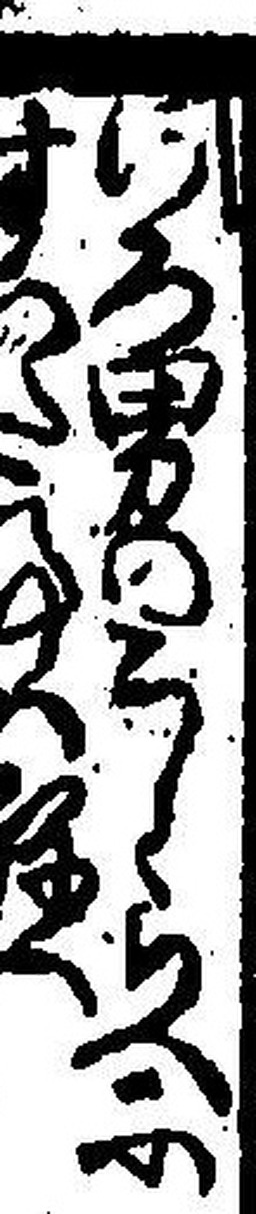すいた事はねへ
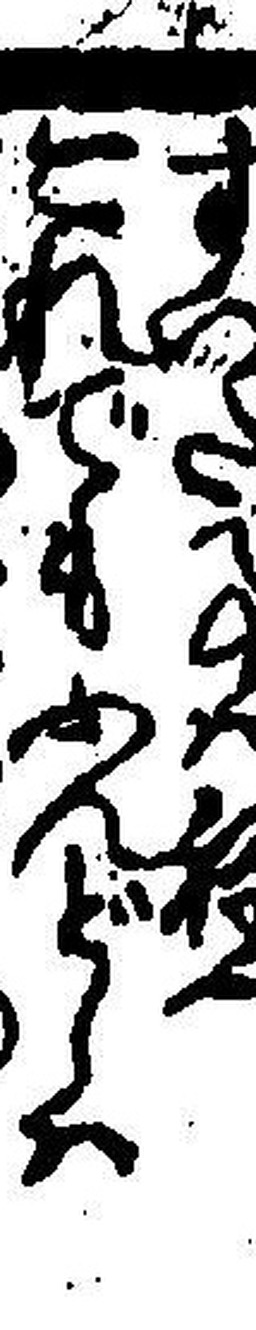これでもふんどしは
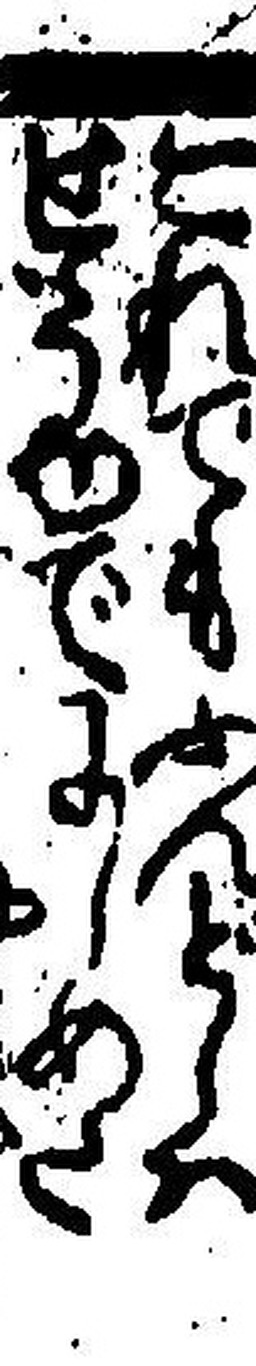せうゆでにしめた
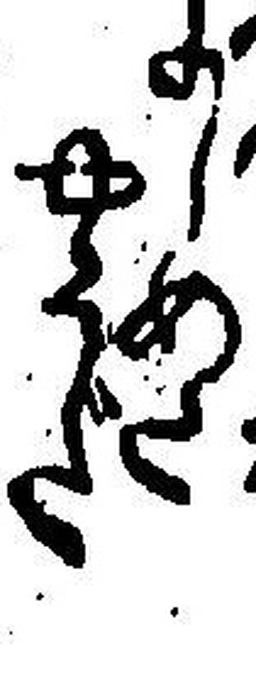やうだ
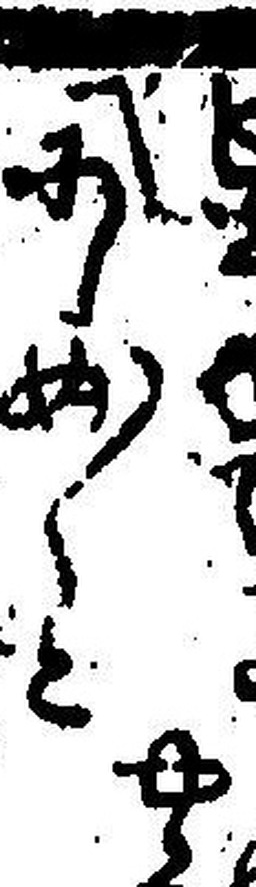〽にしめ〳〵と
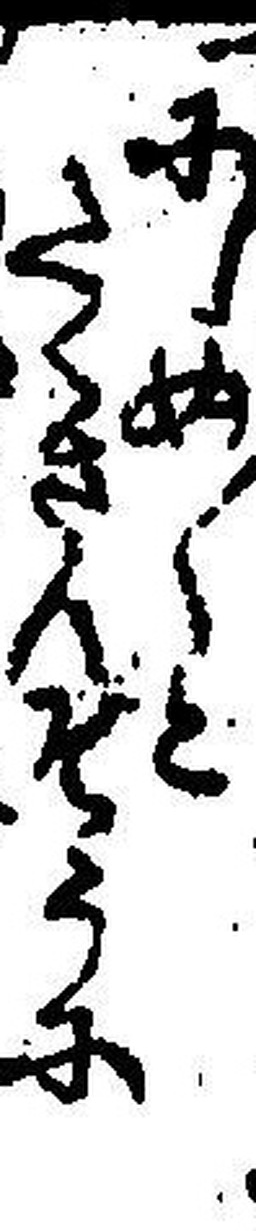たくさんそうに
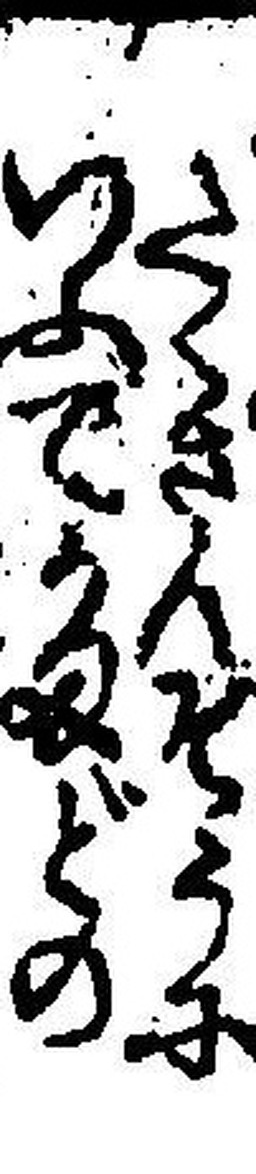いふでかまどの
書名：徳若水縁起金性 / 樹下石上作
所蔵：東京大学総合図書館 General Library in the University of Tokyo, JAPAN
